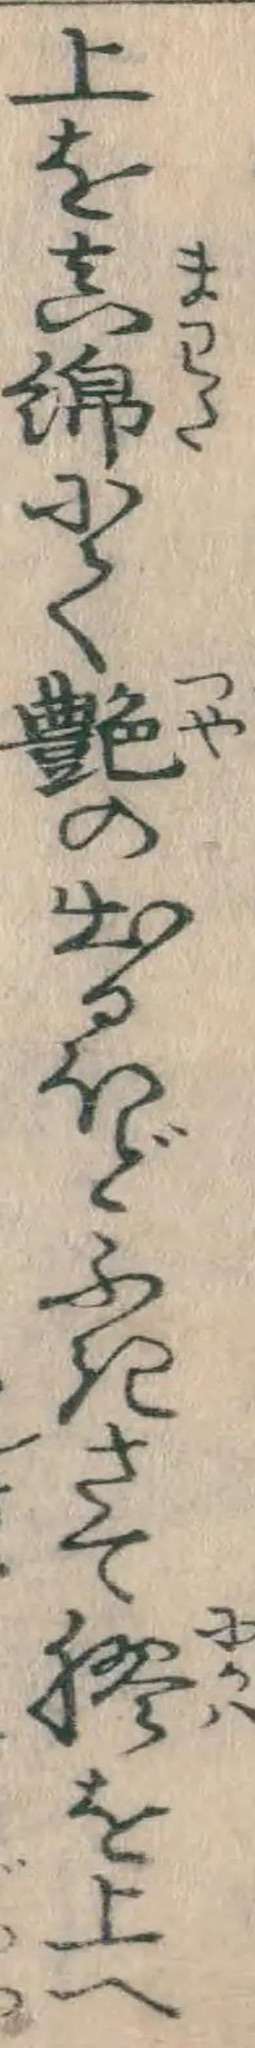上を真綿にて艶の出るほどふきさて膠を上へ
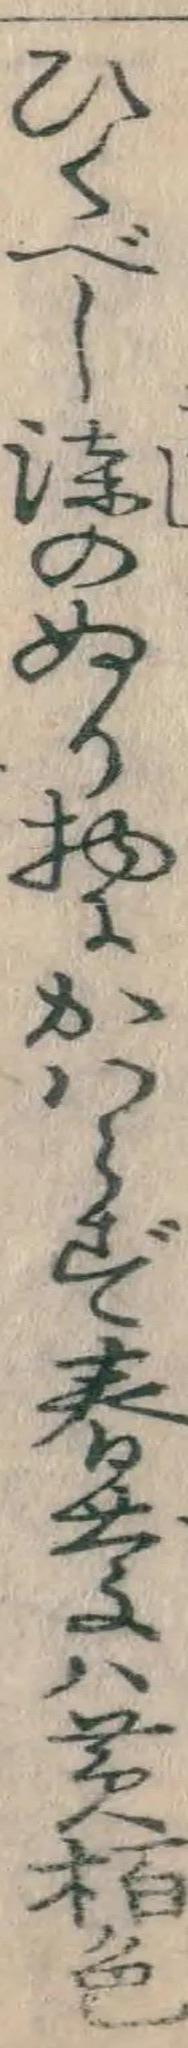ひくべし漆のぬり物にかはらず春慶は黄柏色
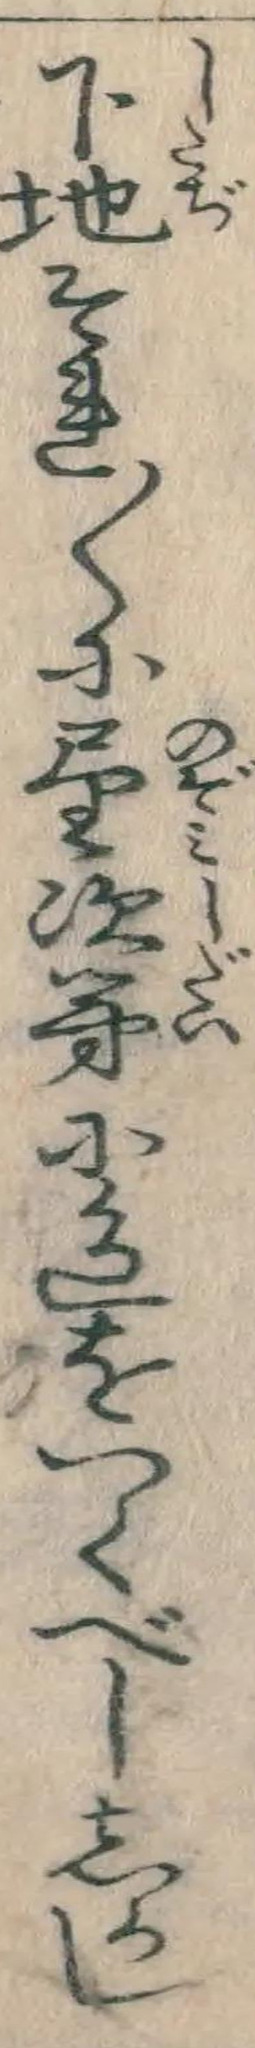下地それ〳〵に望次第に色をつくべししかし
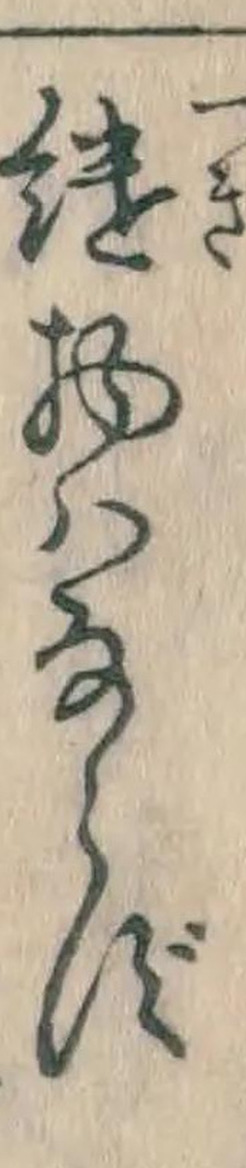継物はならず
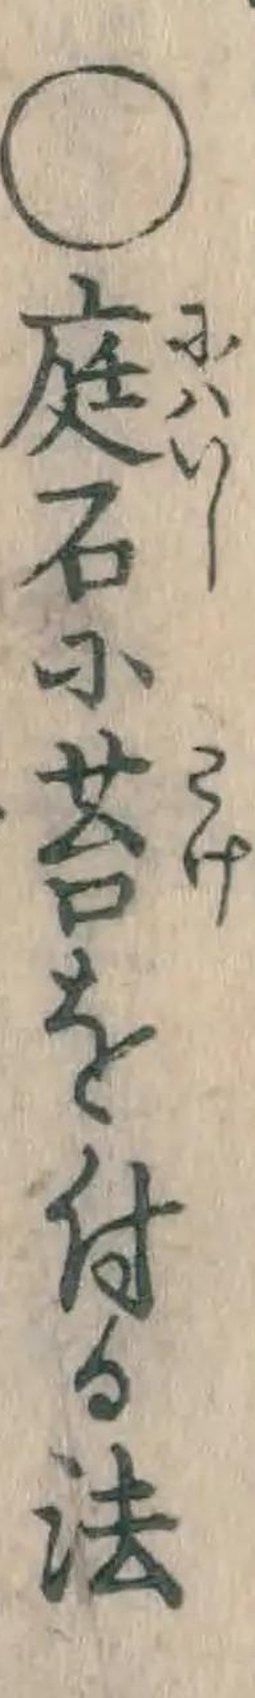○庭石に苔を付る法
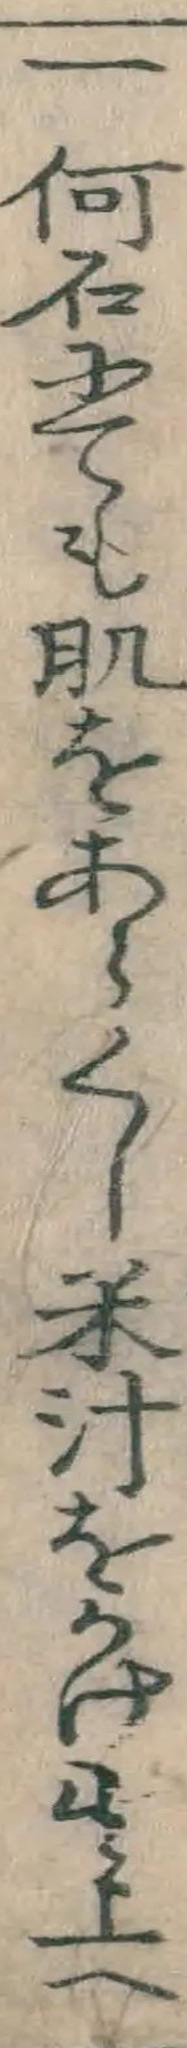一何石にても肌をあらくし米汁をかけ其上へ

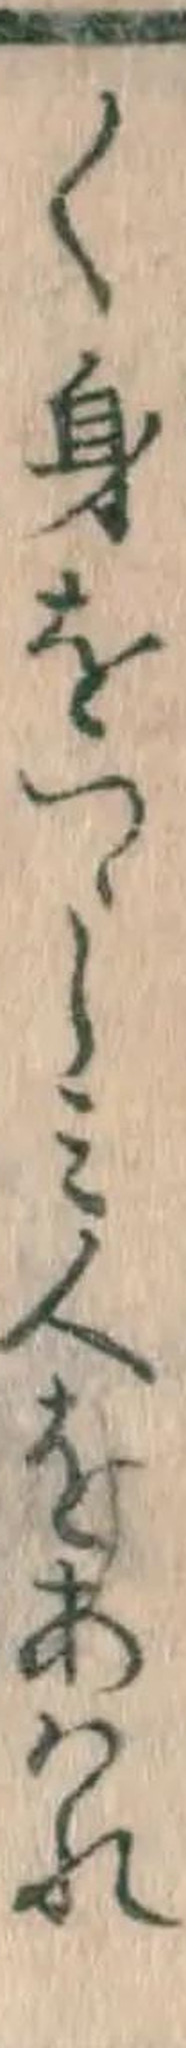〳〵身をつゝしみ人をあはれ
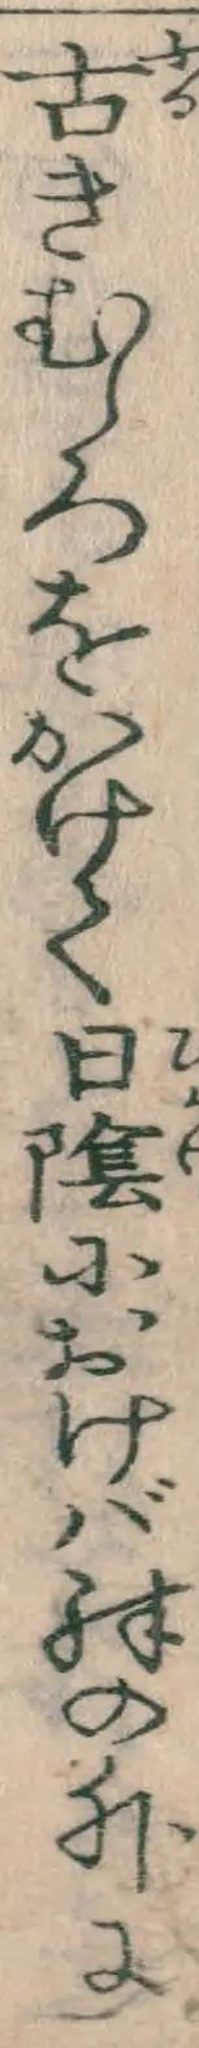古きむしろをかけて日陰におけば殊の外に
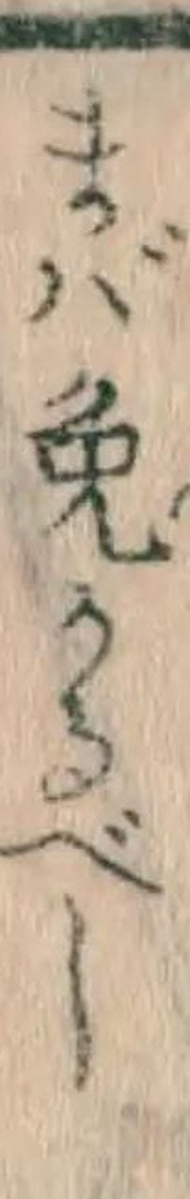まば免かるべし
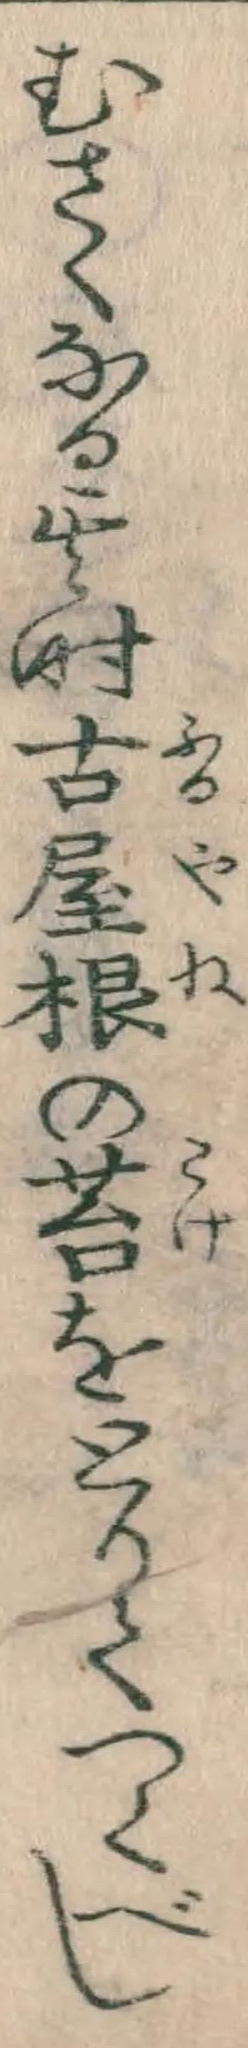むさくなる其時古屋根の苔をとりてつくべし
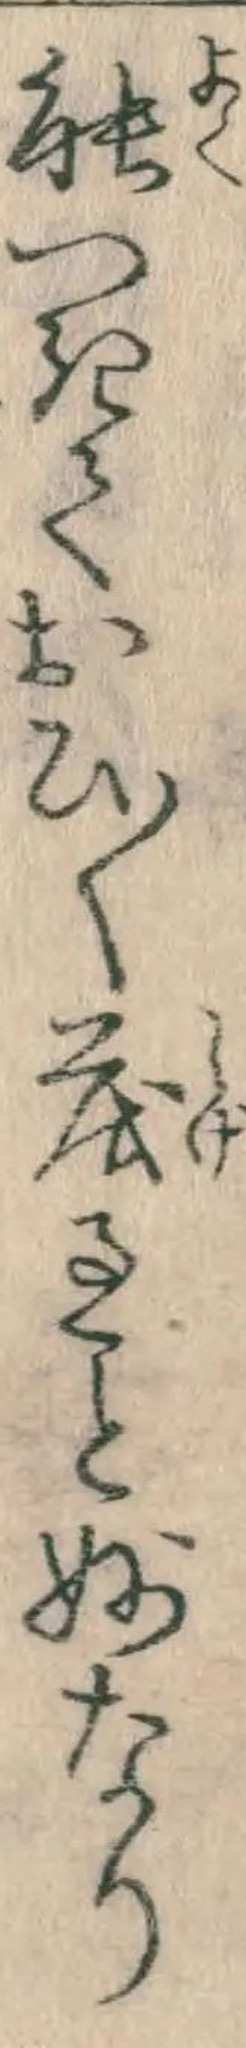能つきておひ〳〵茂ること妙なり
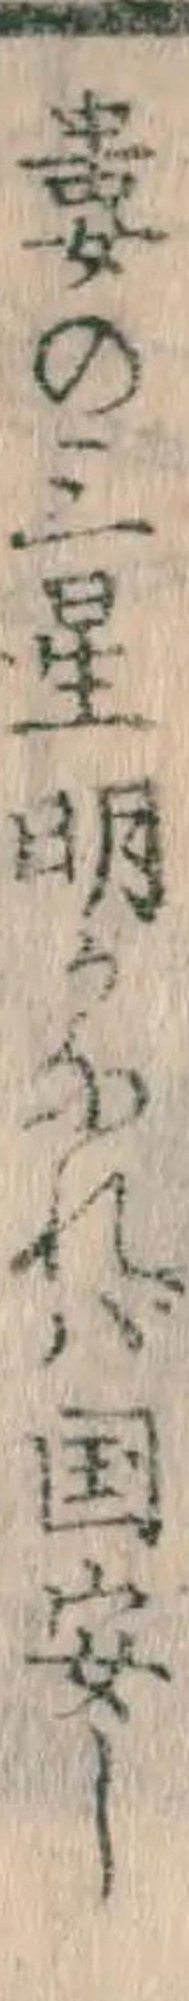婁の三星明かなれば国安し
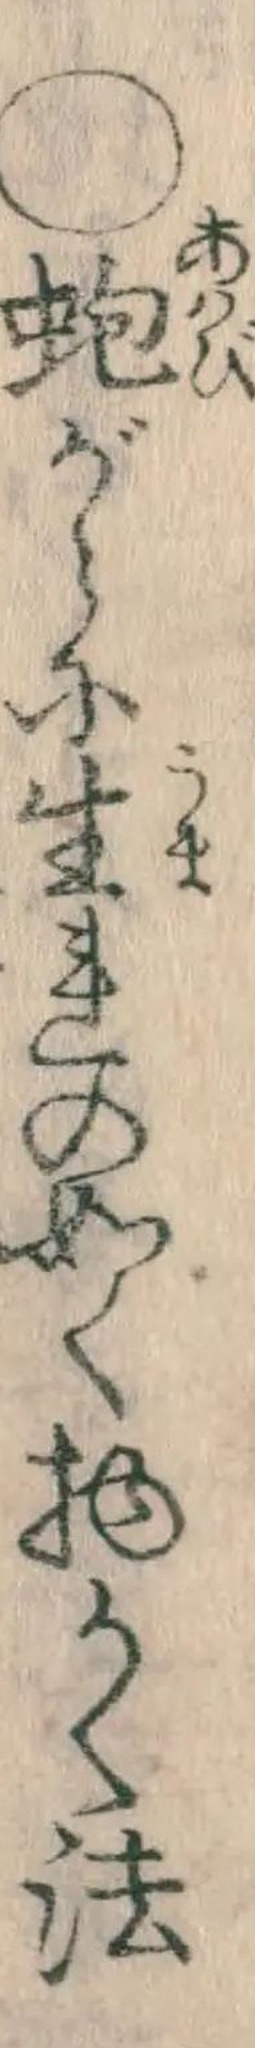○蚫がらに生れの如く物かく法
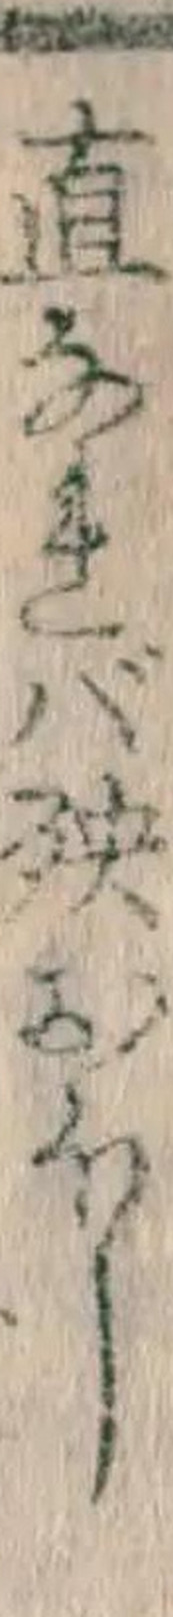直なれば殃おほし
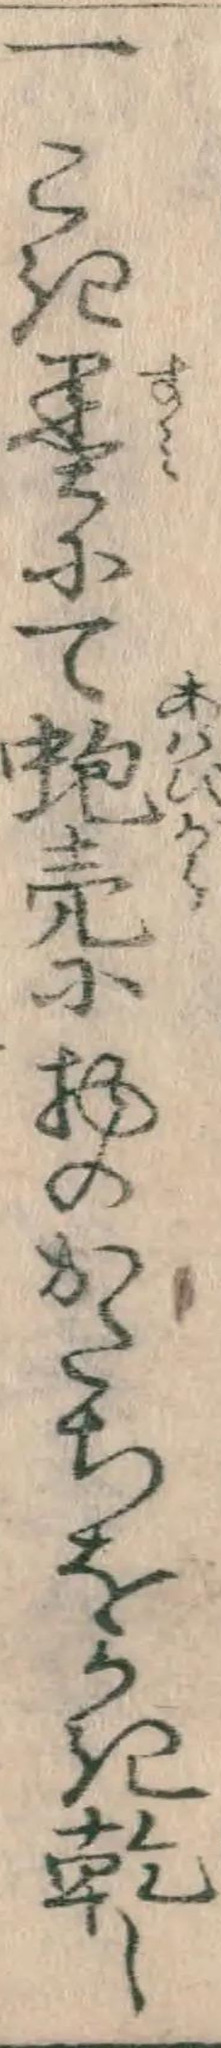一こき墨にて蚫売に物のかたちをかき乾し
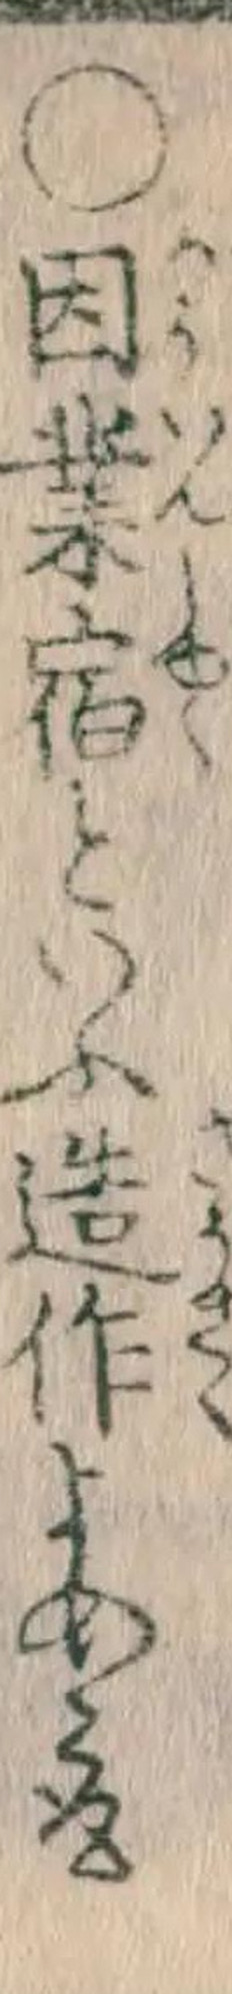○因業宿といふ造作よめ取
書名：広益秘事大全 3巻. [2]
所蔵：国立国会図書館 National Diet Library, JAPAN
